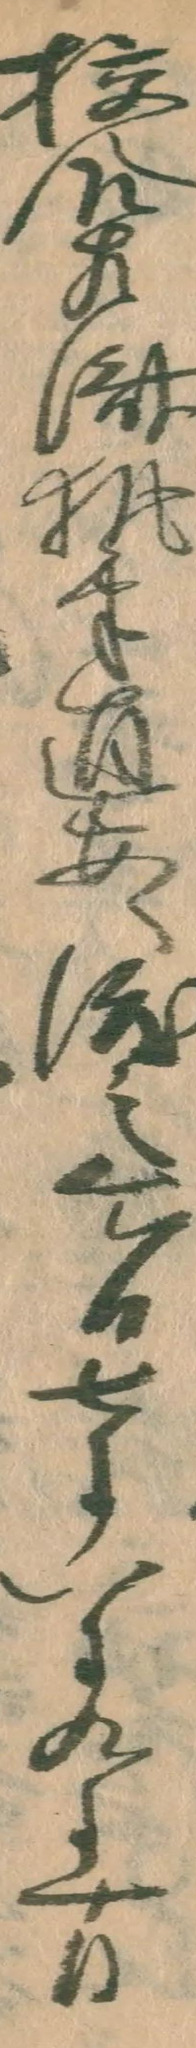校合相済執筆直安へ渡之今日七月八月九月十月
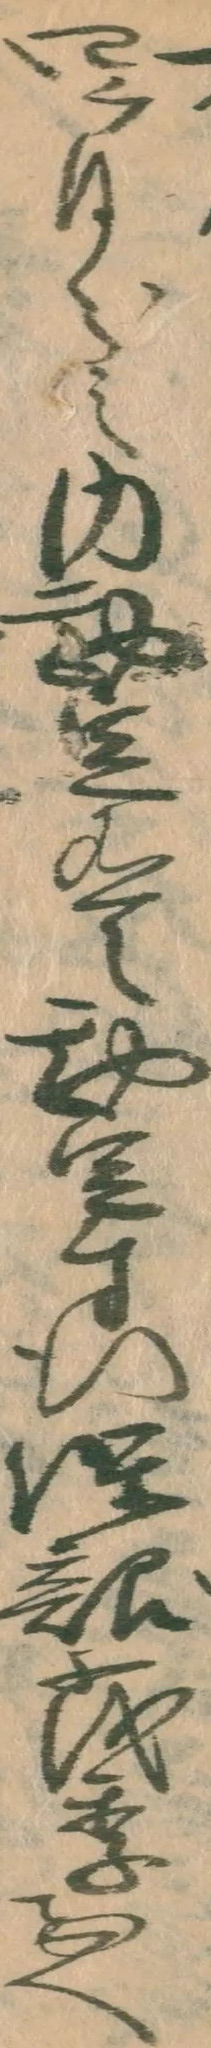四ケ月分之内勘定有之勘定奉行保韶茂季両人
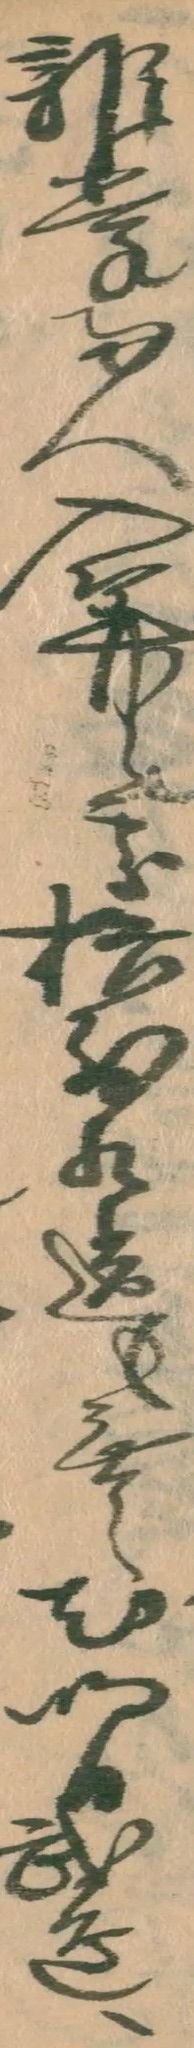雑掌両人入算候処格別相違も無之尤明日武辺へ
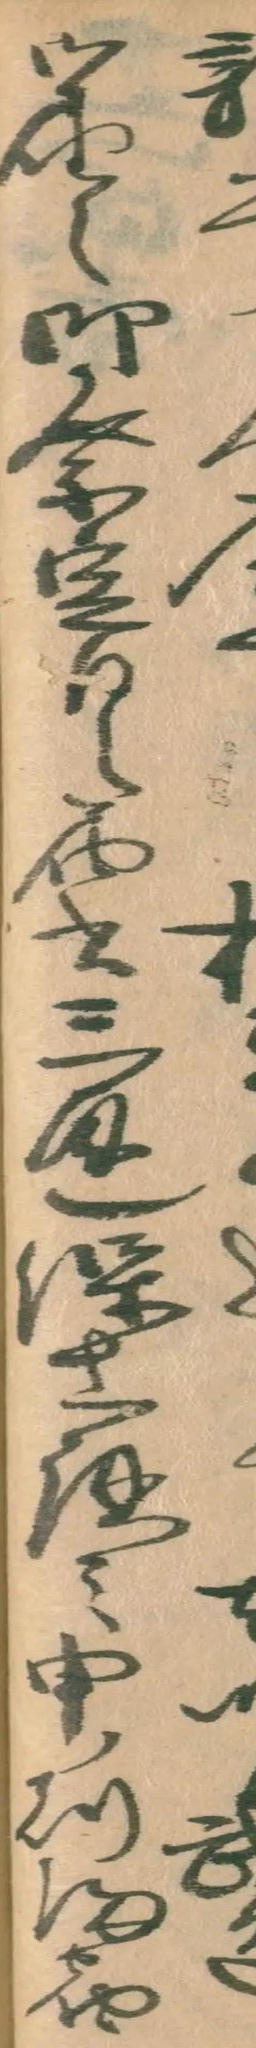御届之御祭定日之届書三通保土認之申ノ刻帰宿
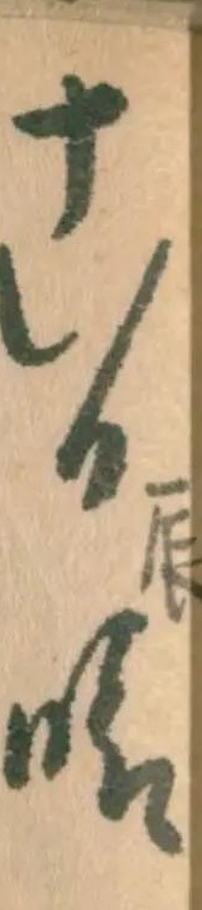十七日卯晴
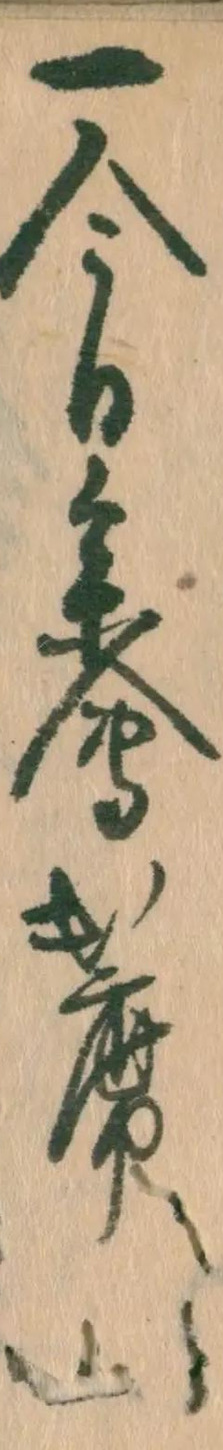一今日参会出席
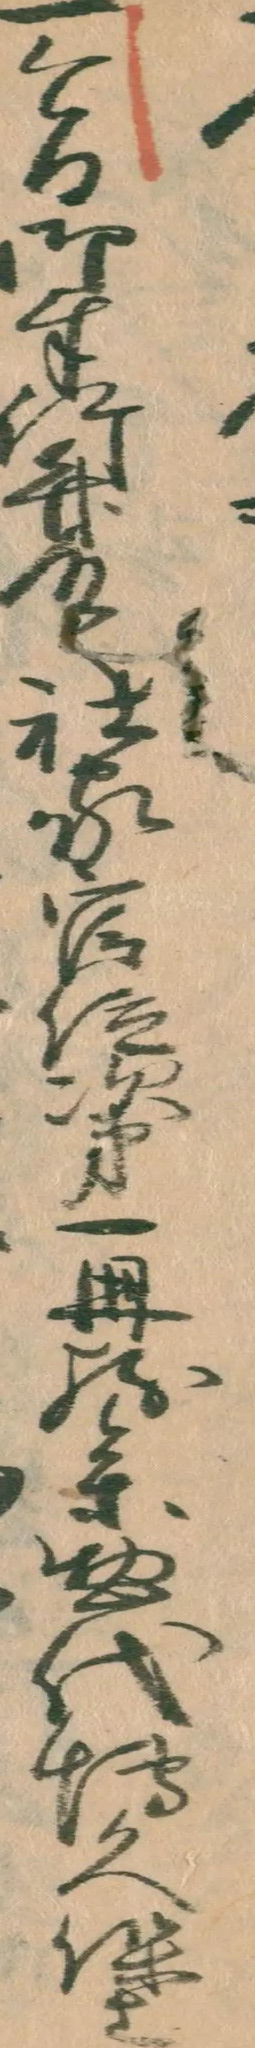一今日御奉行弁殿社家官位次第一冊持参惣代博久保土
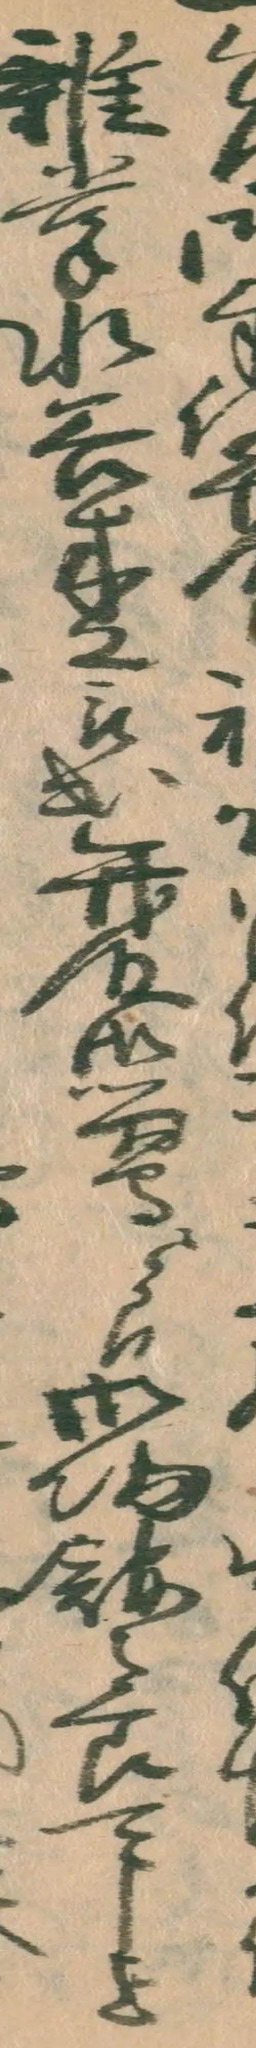雑掌水谷木工被出弁殿御留守ニ候間御帰館之節可申上
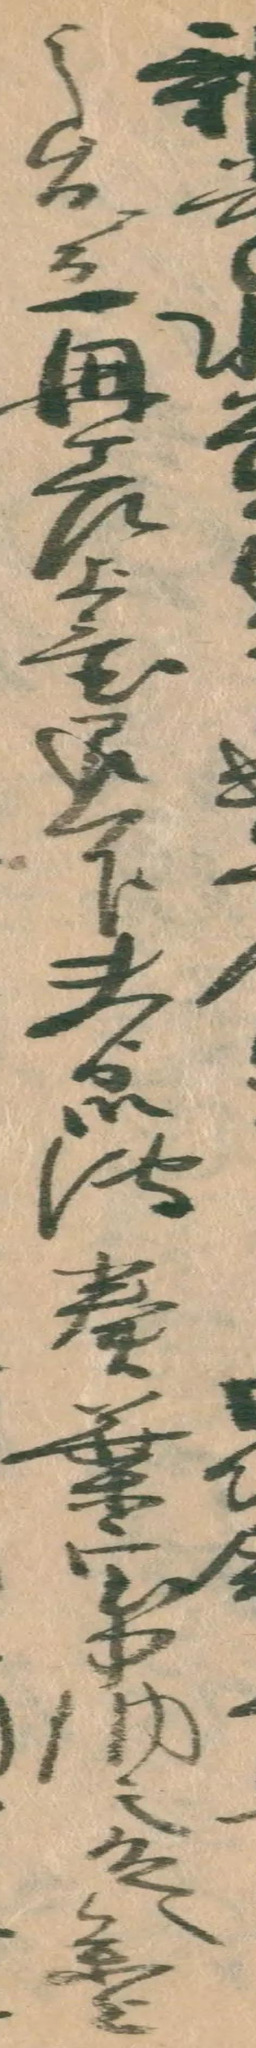之旨ニ而一冊差上置退下夫ゟ御伝奏葉室中納言殿へ参上
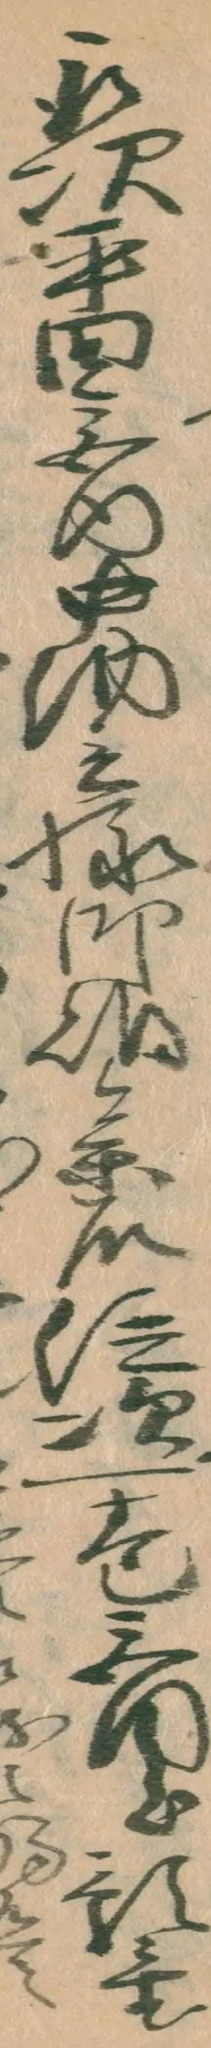取次平田宮内中納言様御朝参故仰次一巻宮内迄預置
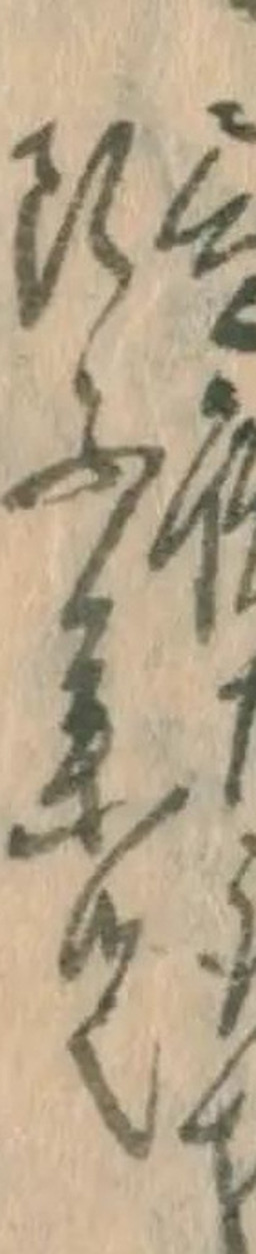断不参候也
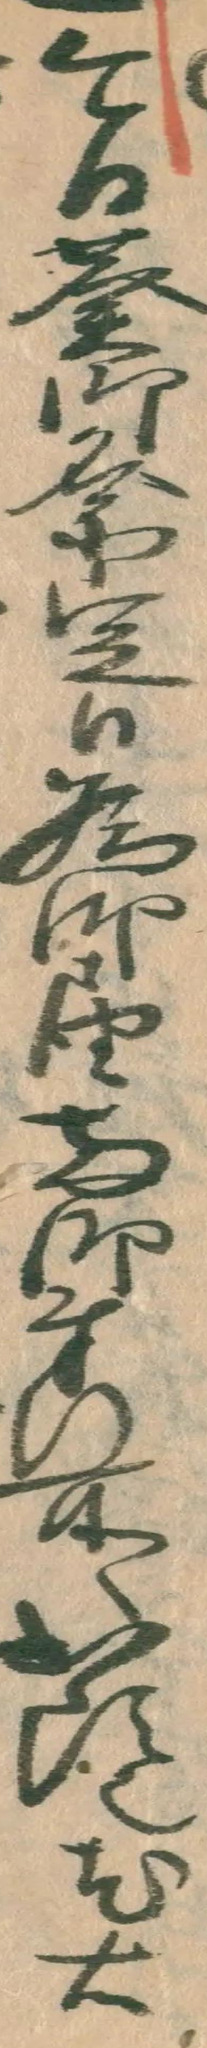一今日葵御祭定日為御届両御奉行所へ出頭也尤右
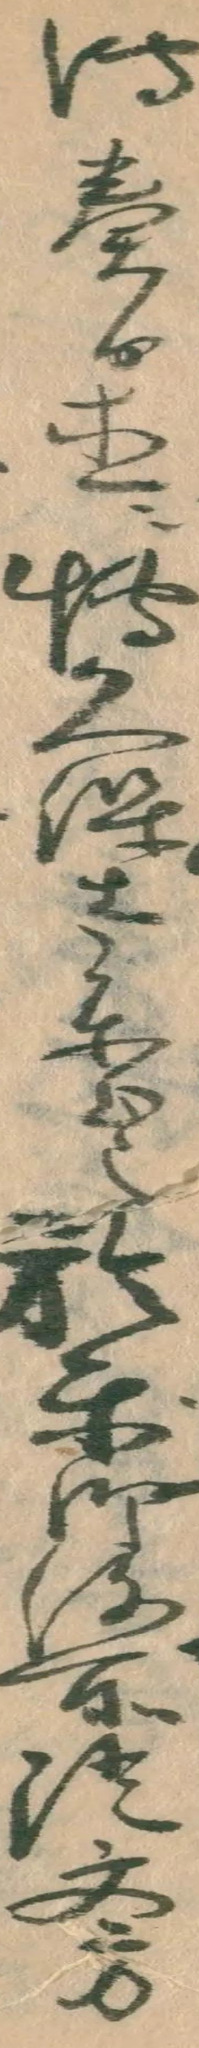伝奏ゟ直ニ博久保土参上也於東御役所証文方
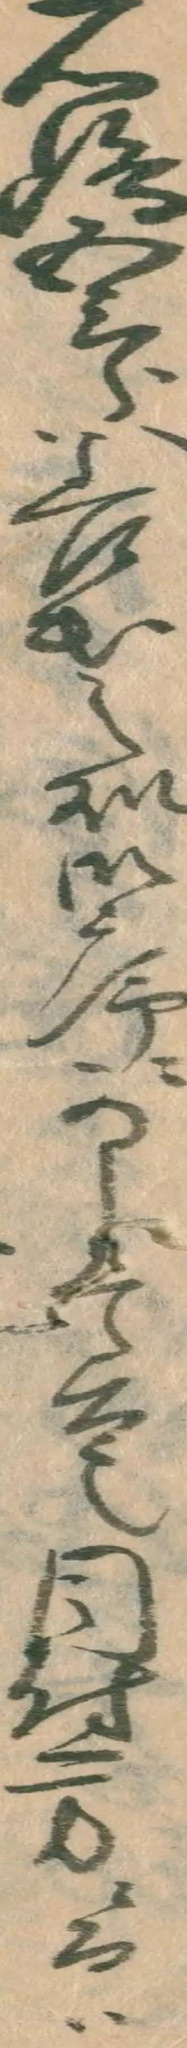石嶋五三郎へ差出候処御序ニ可申上候旨也目付方ニ而ハ
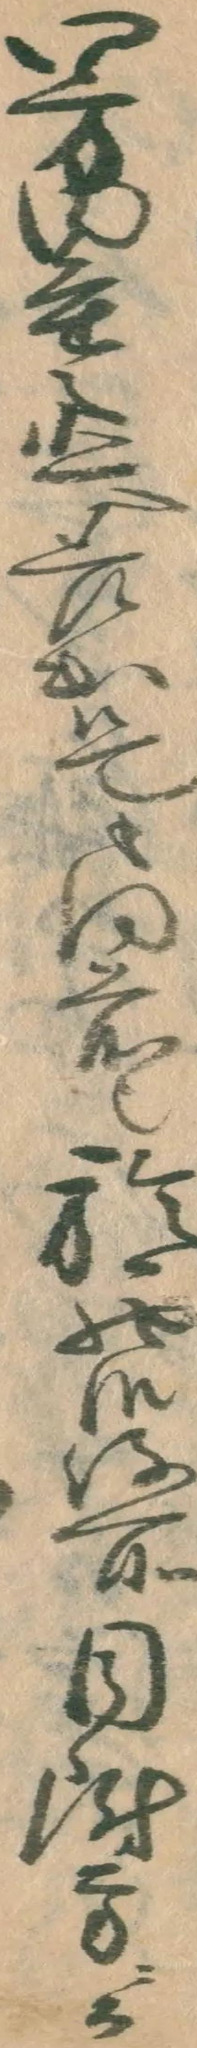四方内重之丞へ差出候ても同前也於西御役所目付方ニ而
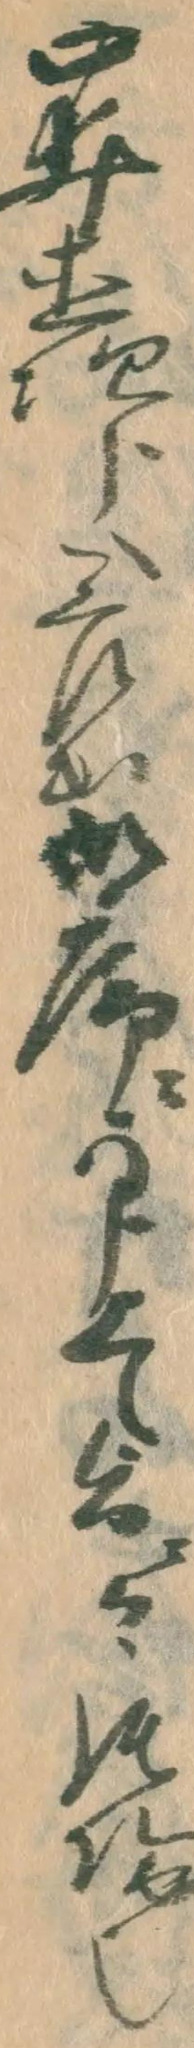中井直次郎へ差出御序ニ可申上候旨ニ而罷帰也
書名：賀茂社記録. 第60冊
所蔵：国立国会図書館 National Diet Library, JAPAN
